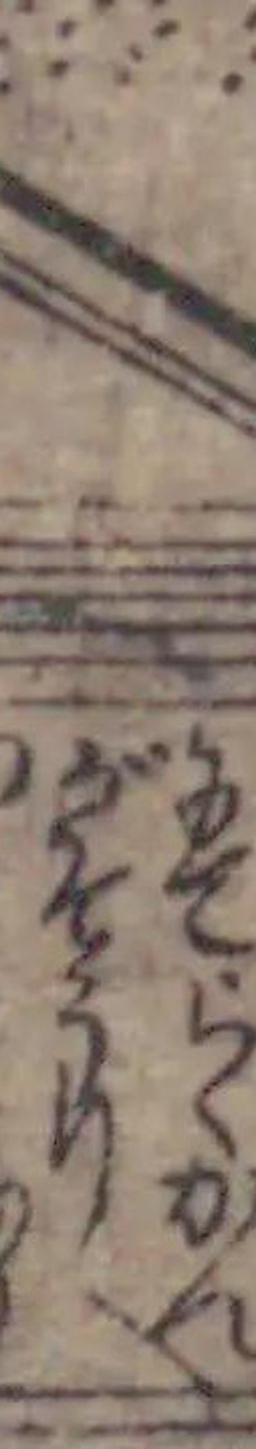がそうり
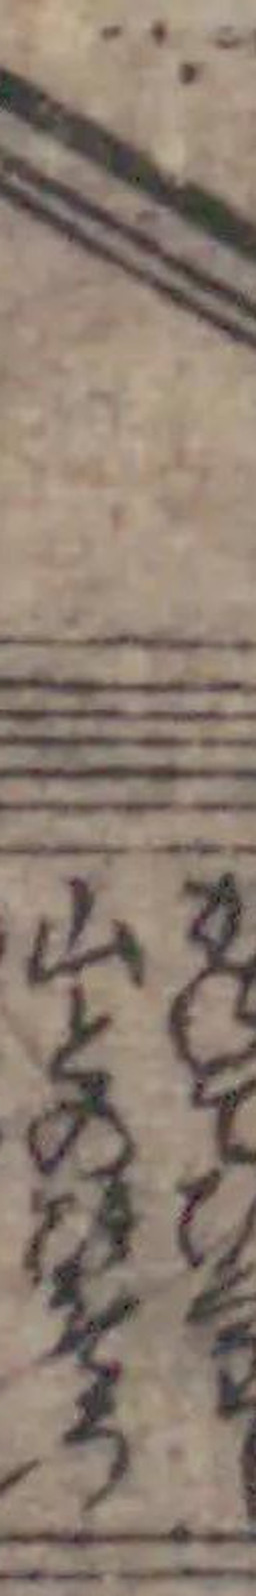山とのひそう
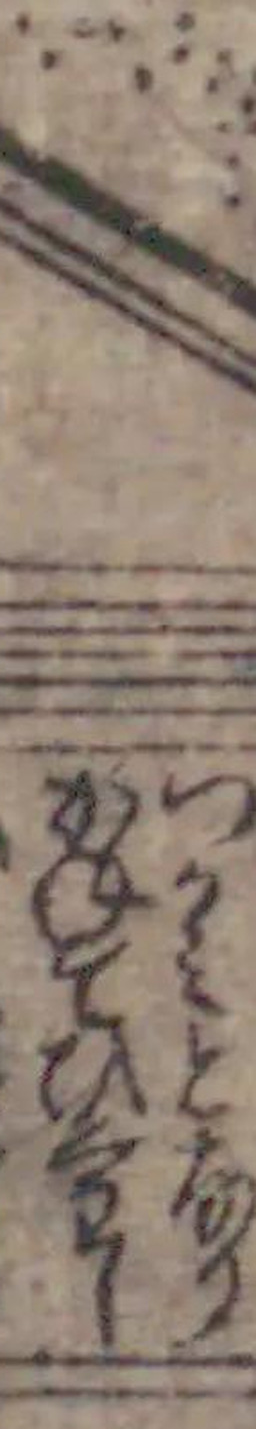かねてひくわし
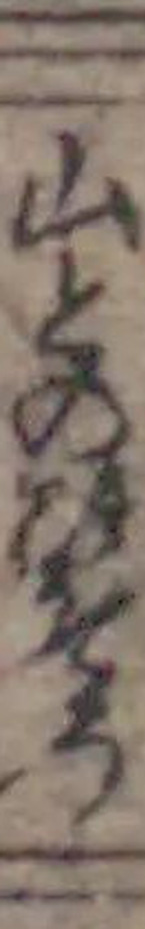山とのひそう
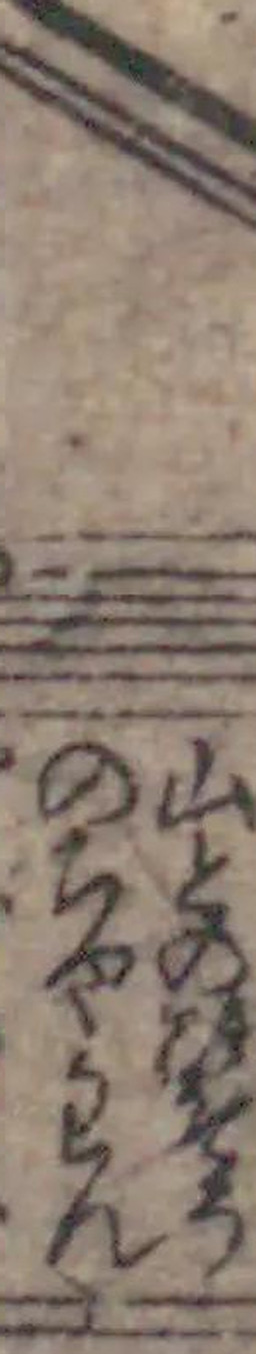のちやわん
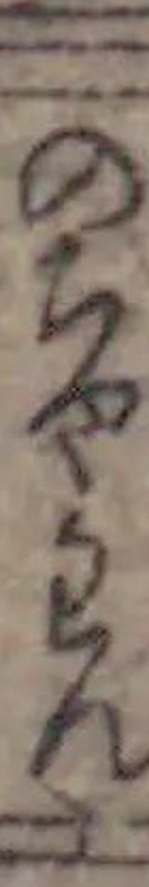のちやわん
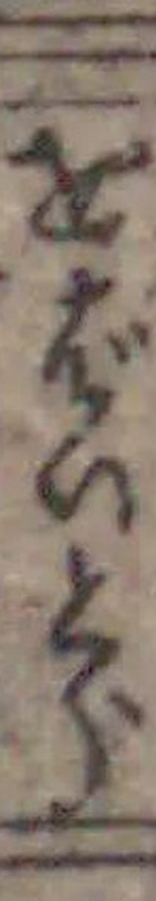をばいとら
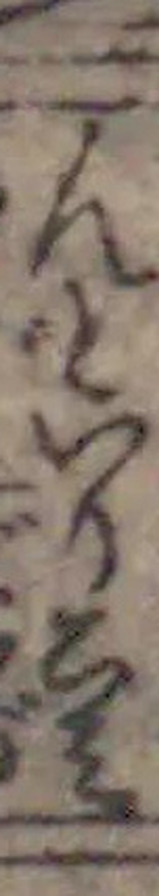んといりこみ
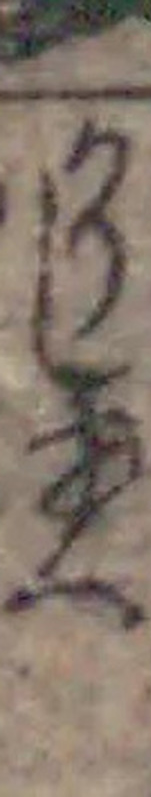かりしゆへ
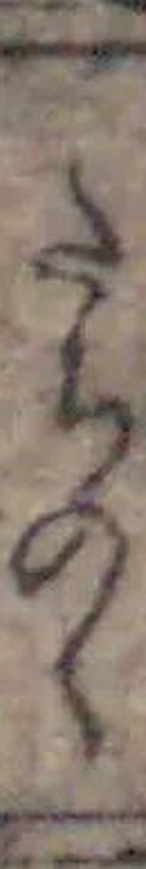たちのく
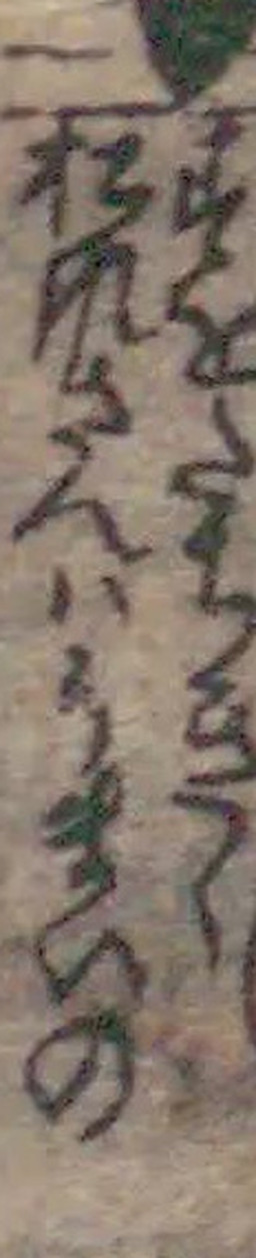松風さんはうまいの

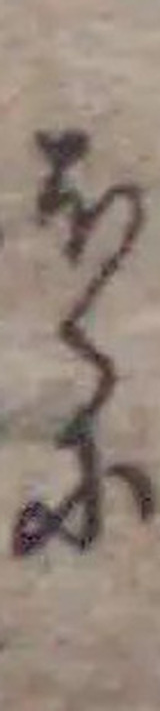ほくに
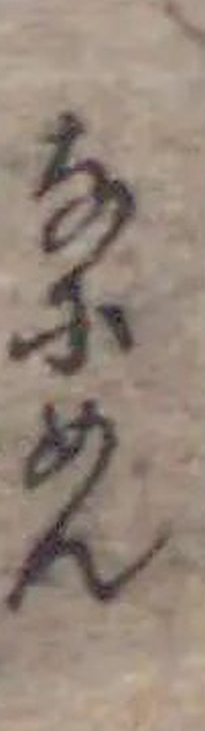なにめん
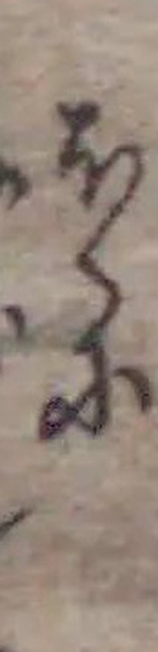ほくに
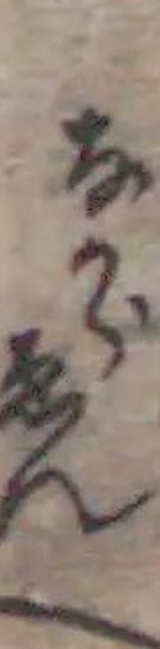なからゑん
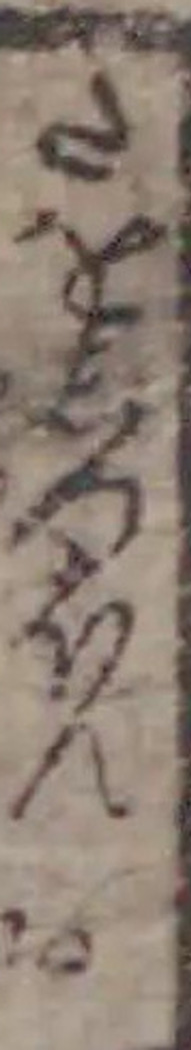たをしつほん
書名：名代干菓子山殿 3巻
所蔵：国立国会図書館 National Diet Library, JAPAN
